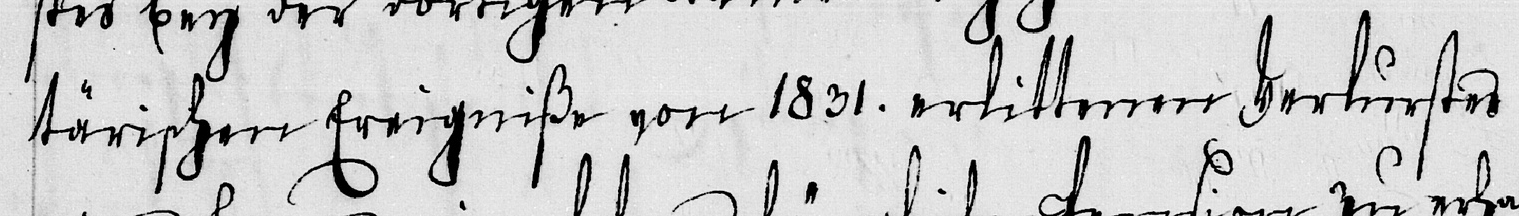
tärischen Ereigniße von 1831. erlittenen Verlustes
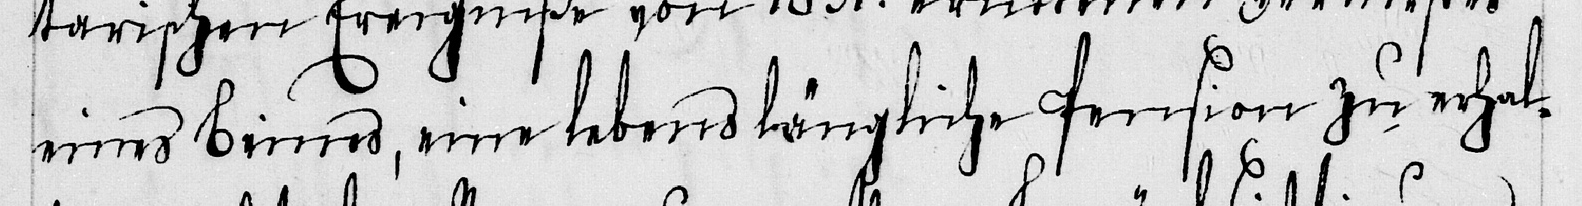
eines Beines, eine lebenslängliche Pension zu erhal¬
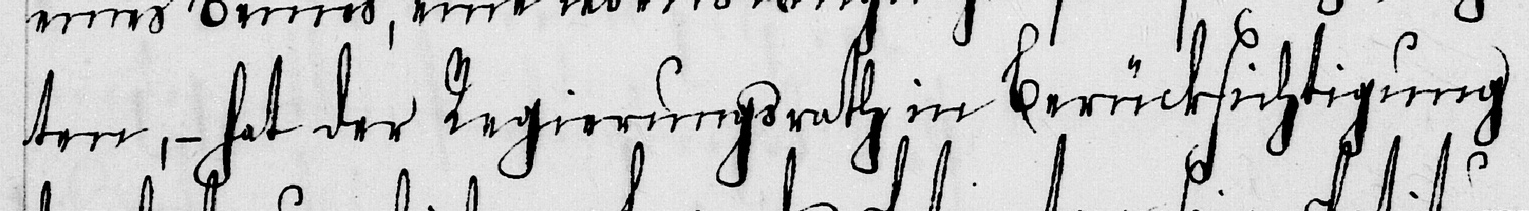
ten, – hat der Regierungsrath in Berücksichtigung
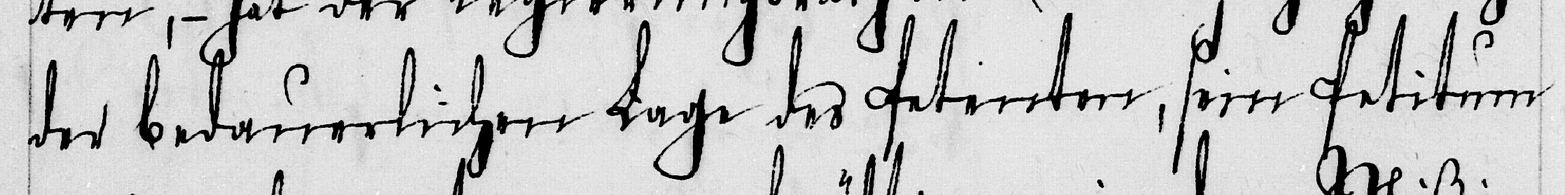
der bedauerlichen Lage des Petenten, sein Petitum
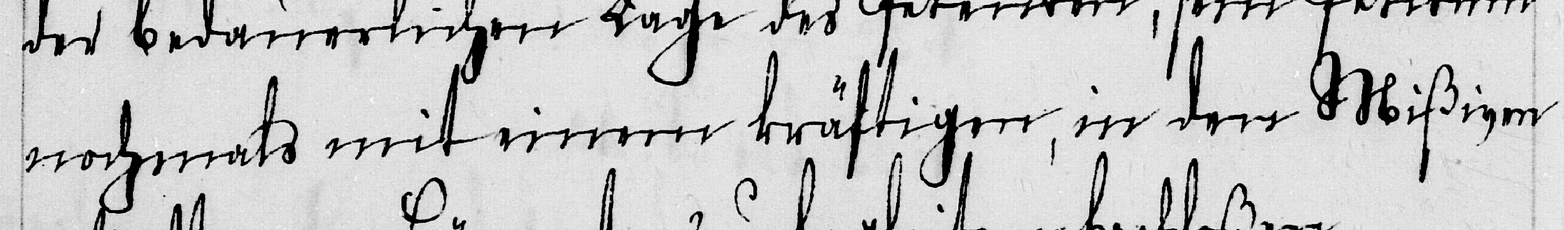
nochmals mit einem kräftigen, in den Mißiven
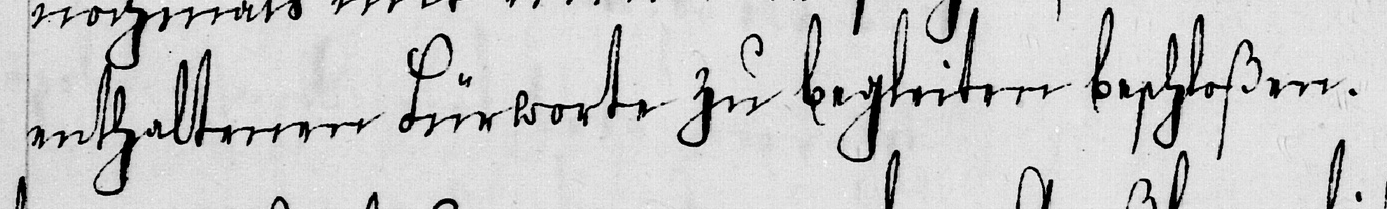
enthaltenen Fürworte zu begleiten beschloßen.
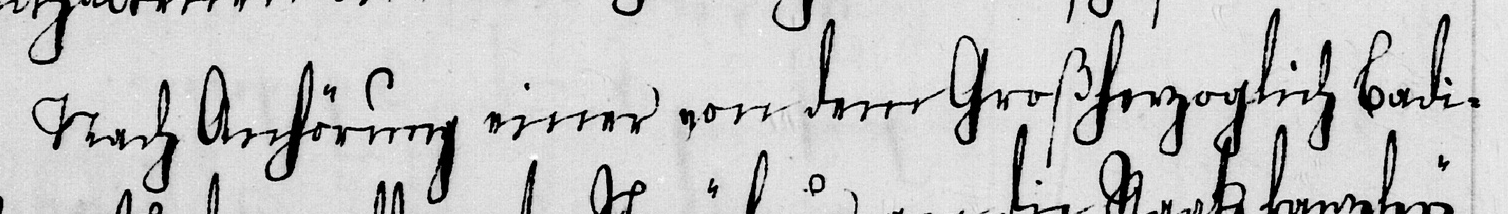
Nach Anhörung einer von dem Großherzoglich Badi¬
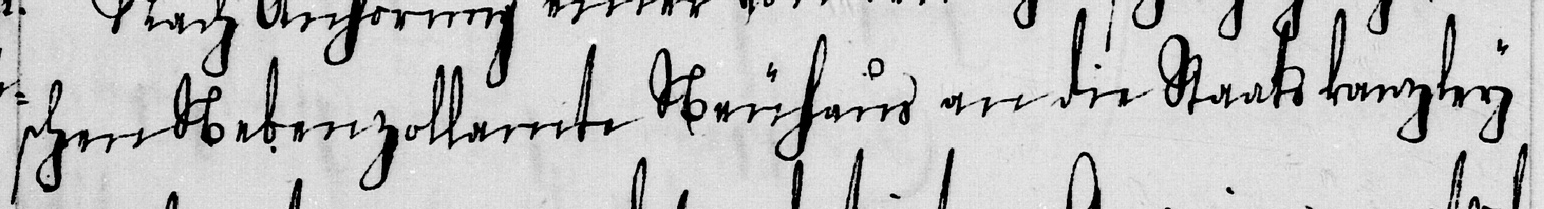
schen Nebenzollamte Neuhaus an die Staatskanzley
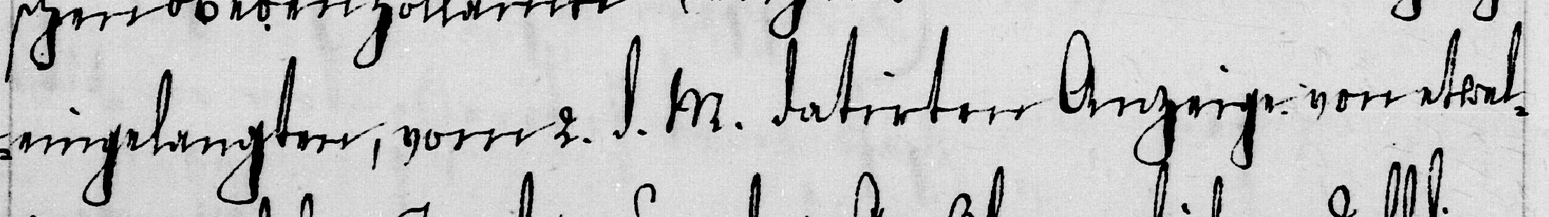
eingelangten, vom 2. d. M. datirten Anzeige von etwel¬
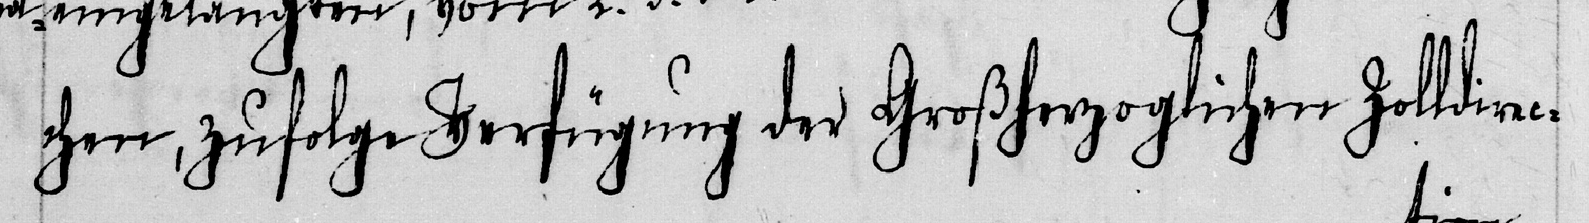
chen, zufolge Verfügung der Großherzoglichen Zolldirec
